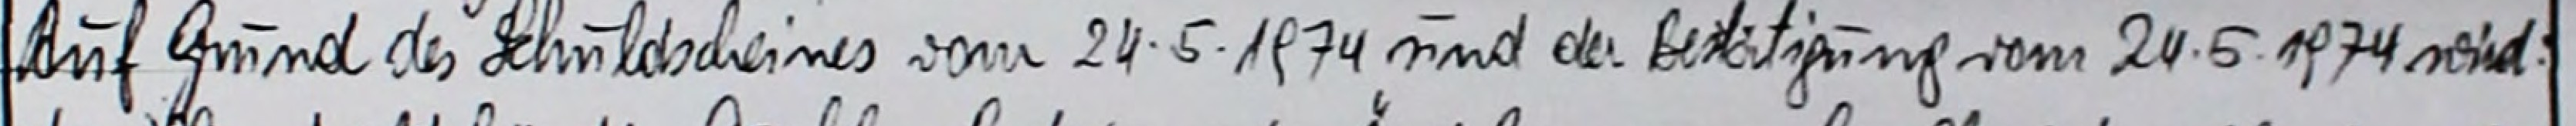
Auf Grund des Schuldscheines vom 24.5.1974 und der Bestätigung vom 24.5.1974 wird:
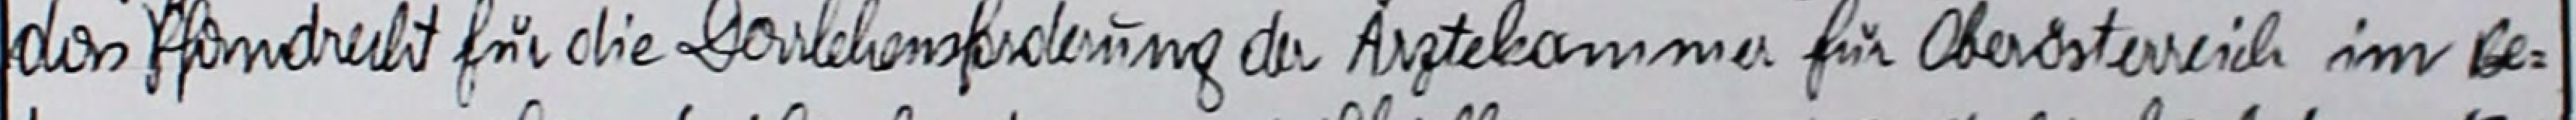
das Pfandrecht für die Darlehensforderung der Arztekammer für Oberösterreich im be=
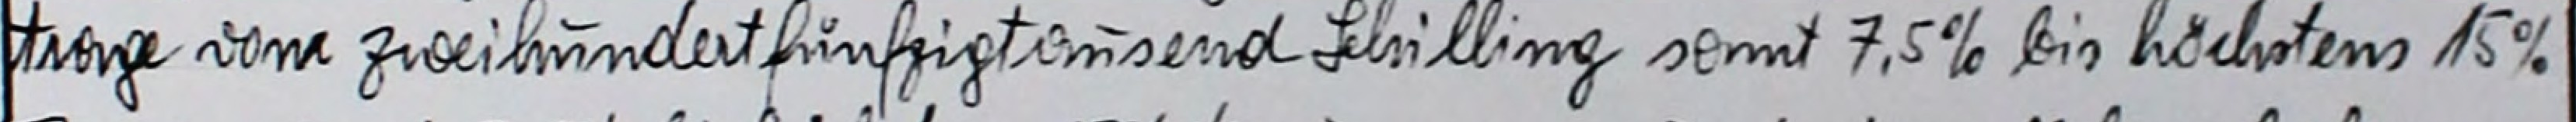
trage vom zweihundertfunfzigtausend Schilling samt 7,5 % bis höchstens 15 %
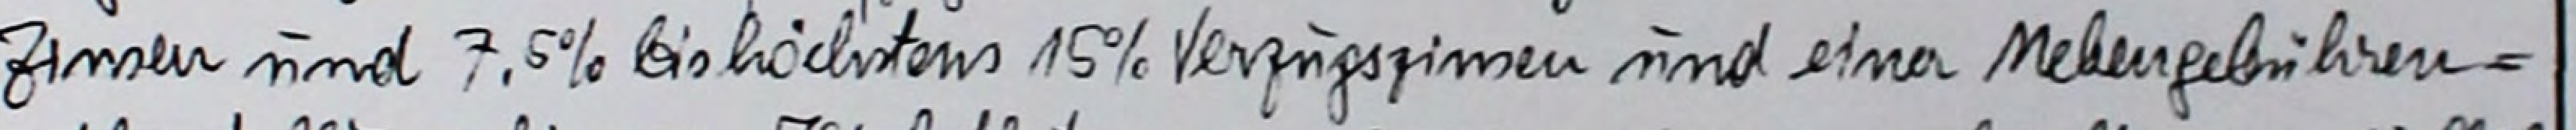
Zinsen und 7,5 5 bis höchstens 15% Verzugszinsen und einer Nebengebühren=
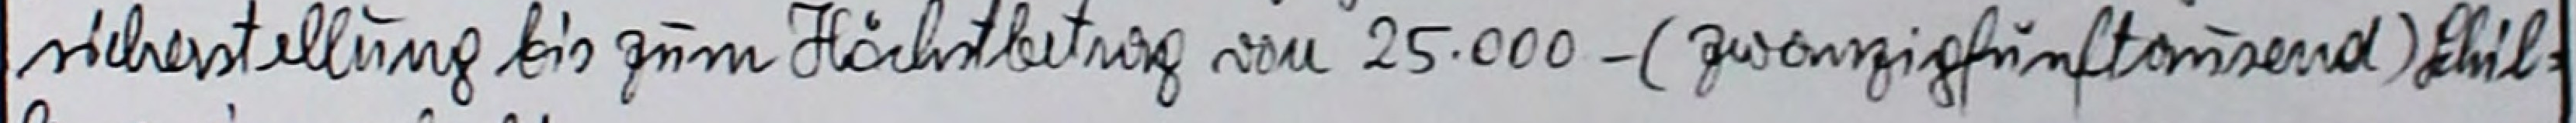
sicherstellung bis zum Höchstbetrag von 25.000 - (zwanzigfünftausend) Schil=
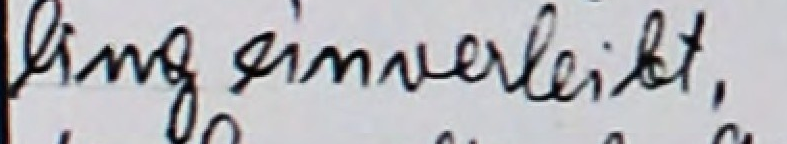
ling einverleibt.
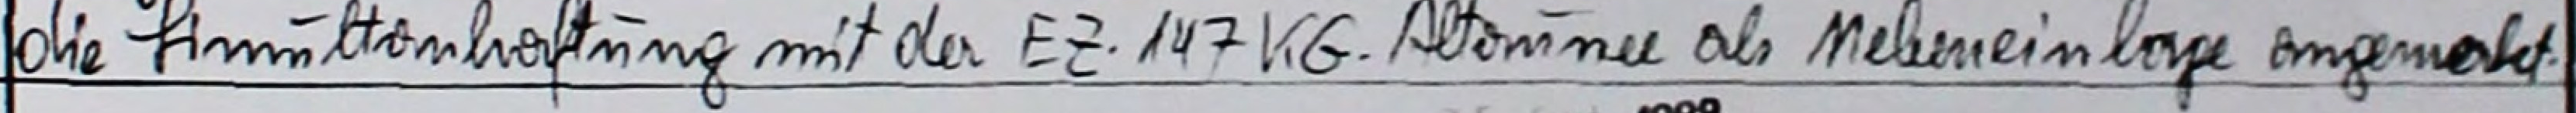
die Simultanhaftung mit der EZ. 14 KG. Altaussee als Nebeneinlage angermerkt.
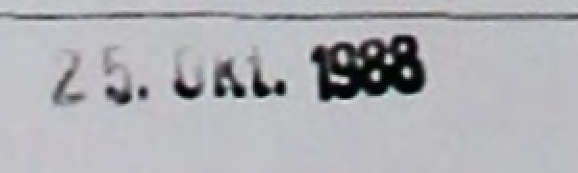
25. Okt. 1988
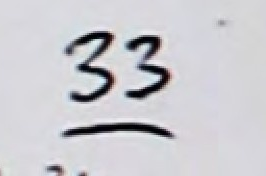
33
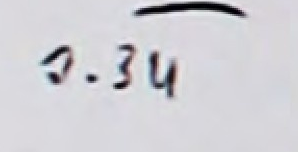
s. 34
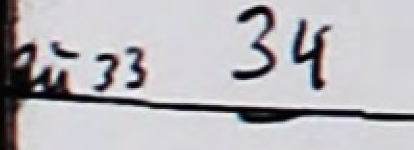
zu 33 34
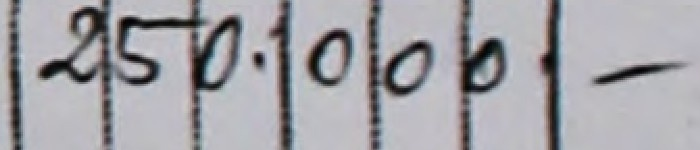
250.000
